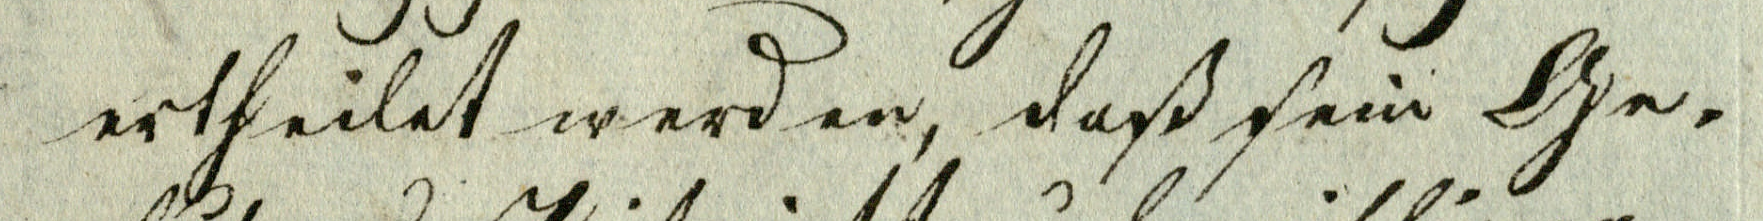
ertheilet werden, daß sein Ge¬
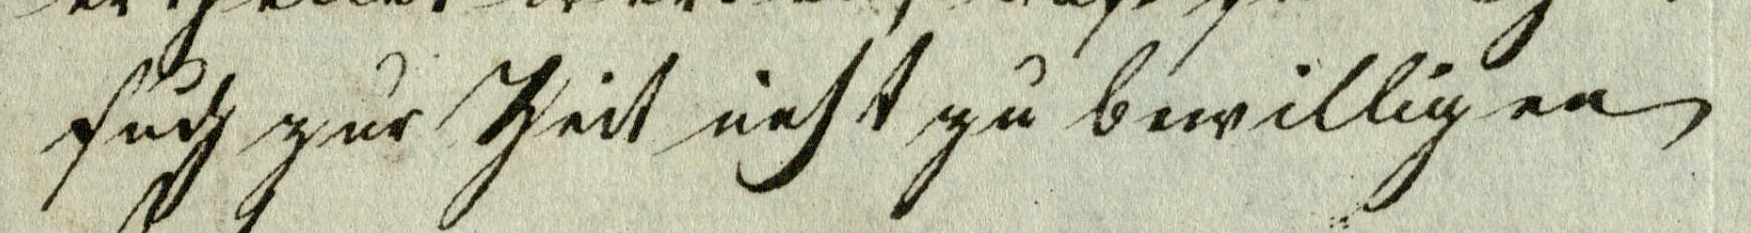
such zur Zeit nicht zu bewilligen
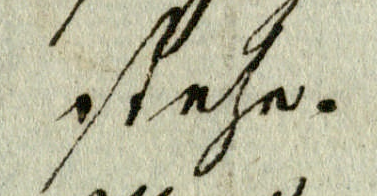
stehe.
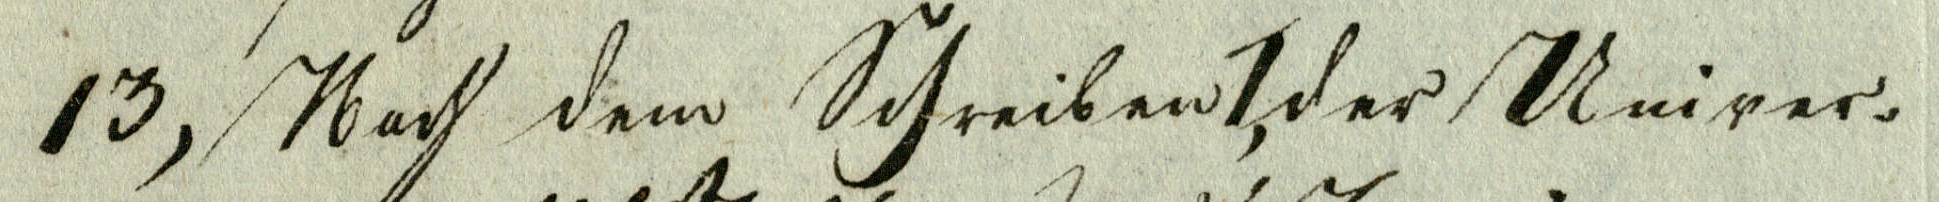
13, Nach dem Schreiben 1, der Univer¬
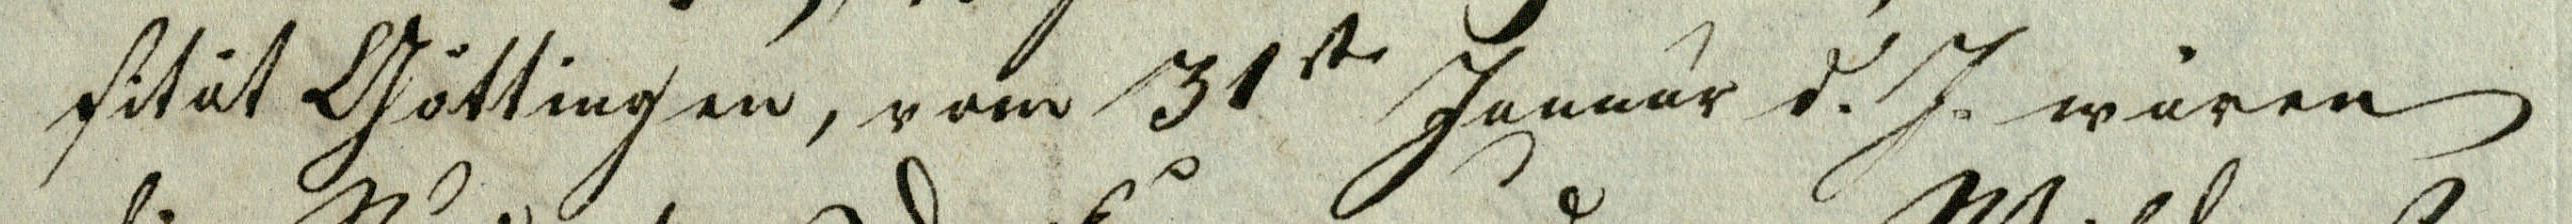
sität Göttingen, vom 31ten Januar d. J. wären
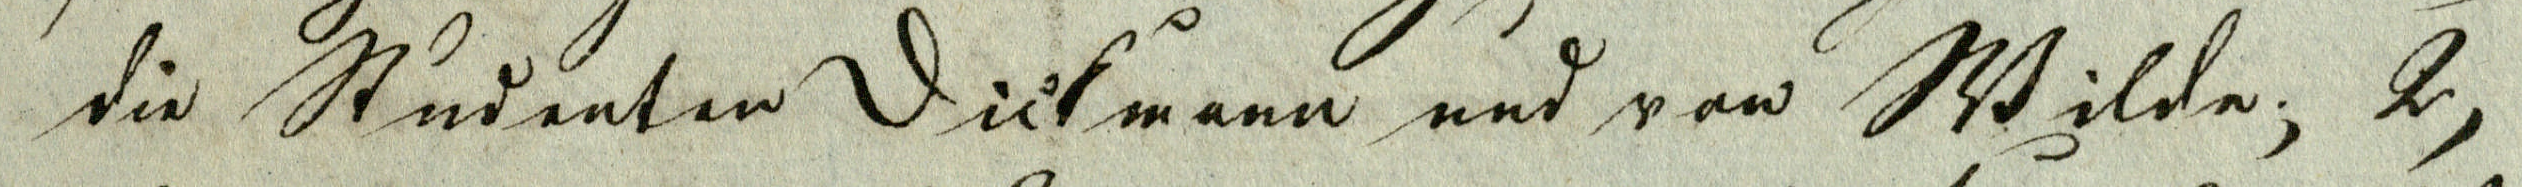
die Studenten Dickmann und von Wilde, 2,
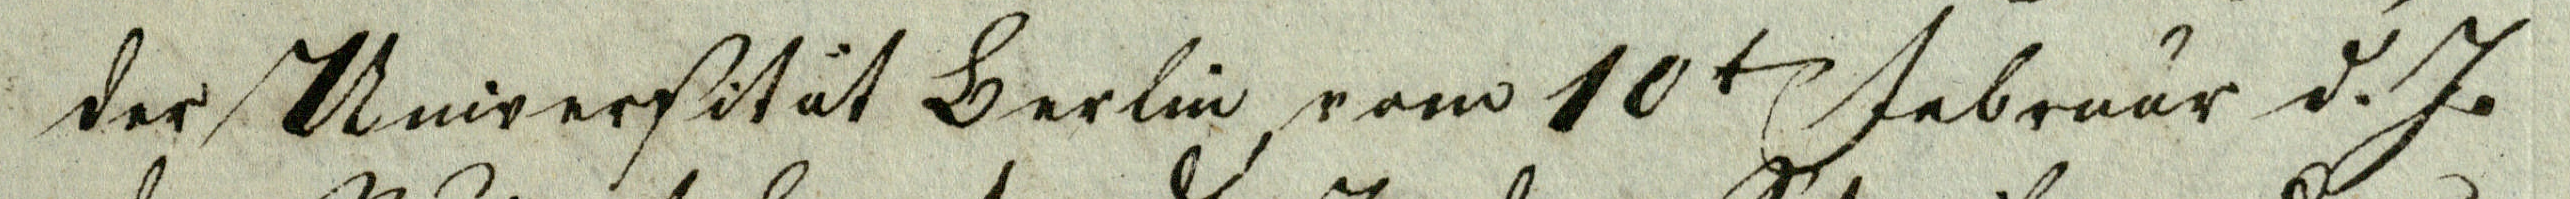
der Universität Berlin, vom 10ten Februar d. J.
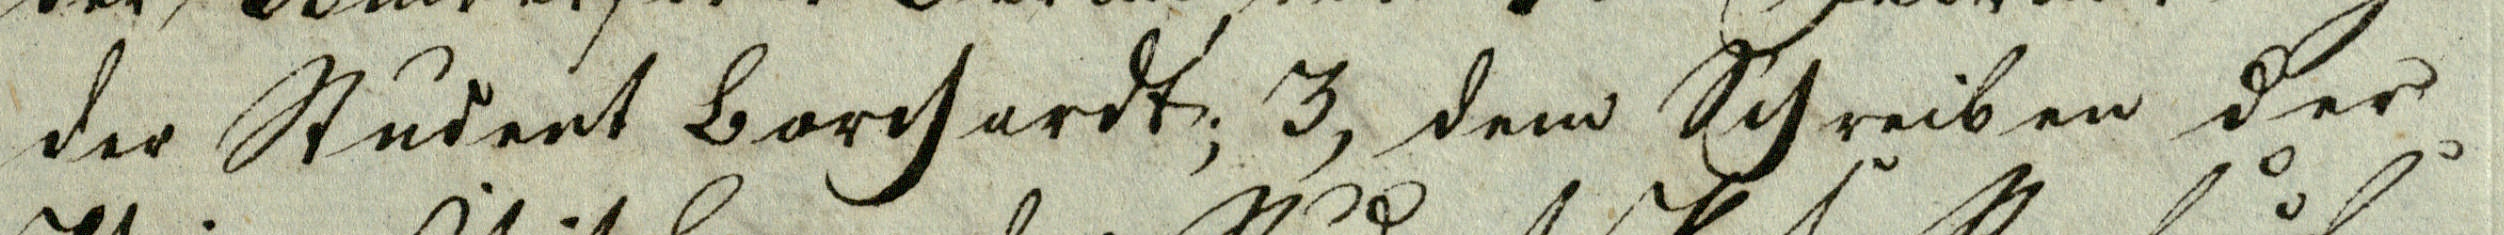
der Student Borchardt; 3, dem Schreiben der
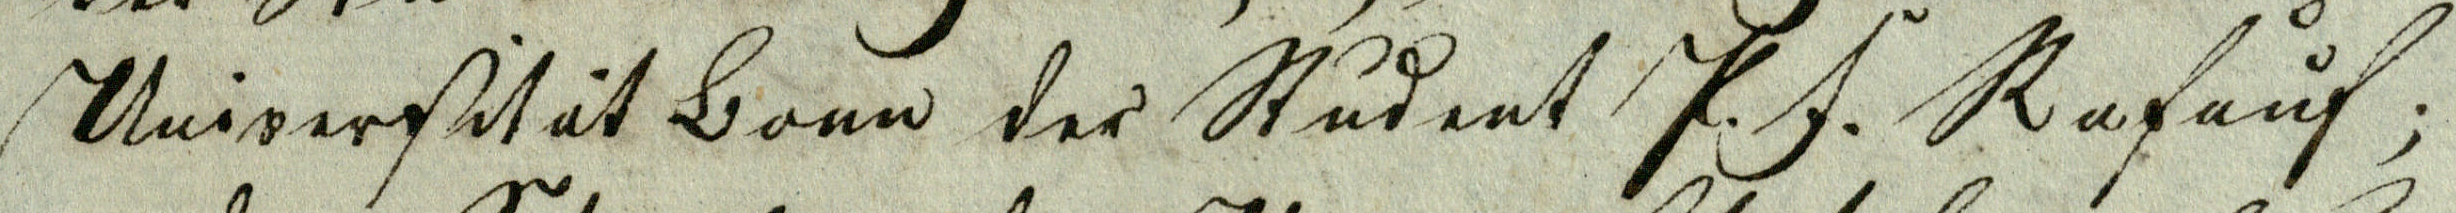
Universität Bonn der Student P. F. Rafauf;
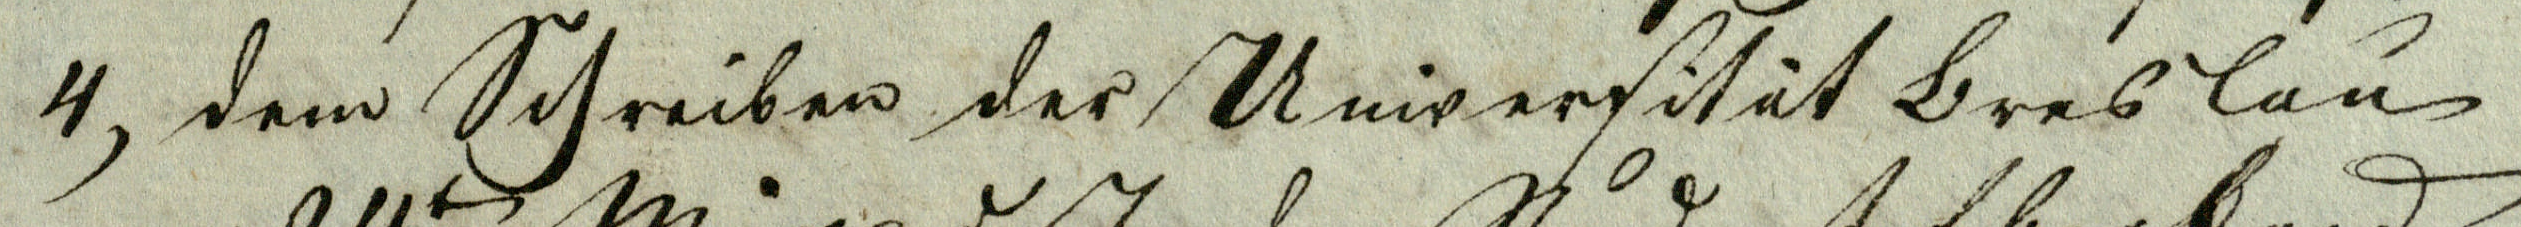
4, dem Schreiben der Universität Breslau
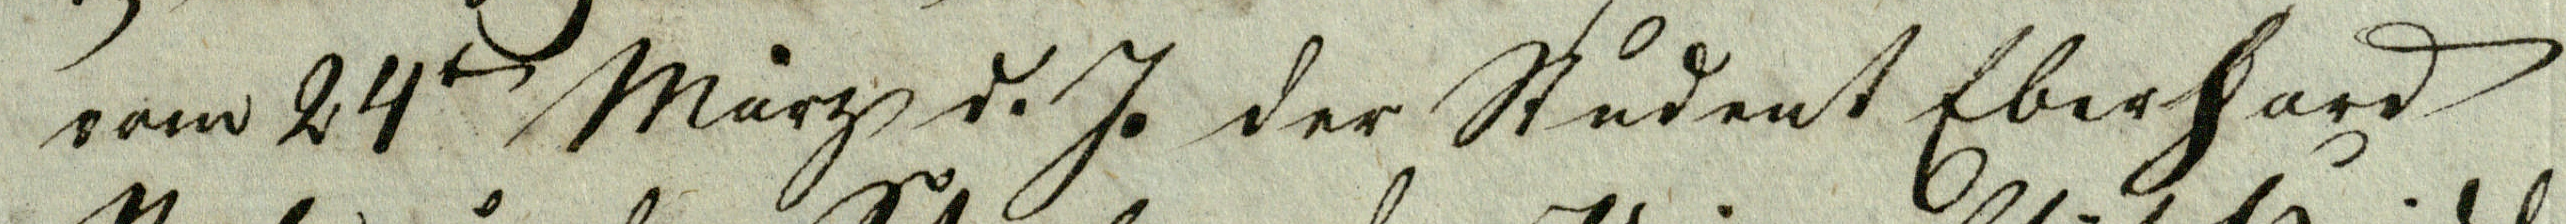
vom 24ten März d. J. der Student Eberhard
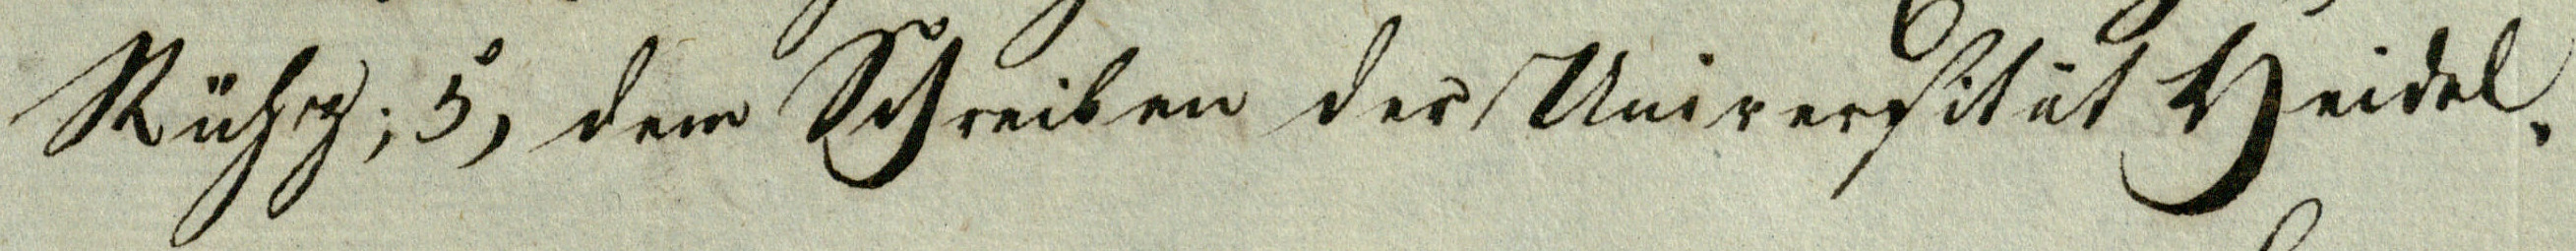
Rühz; 5, dem Schreiben der Universität Heidel¬
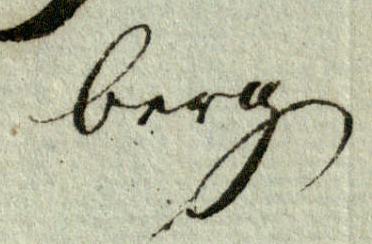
berg
